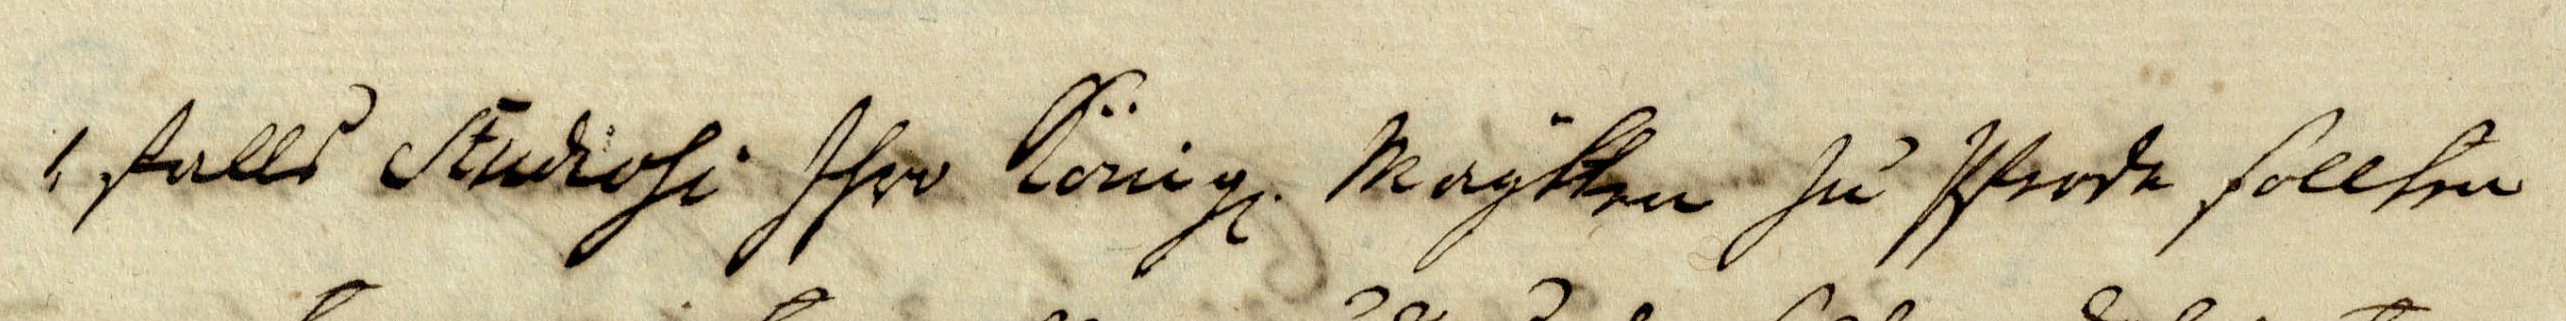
1, falls Studiosi Ihre König. Maÿtten zu Pferde sollten
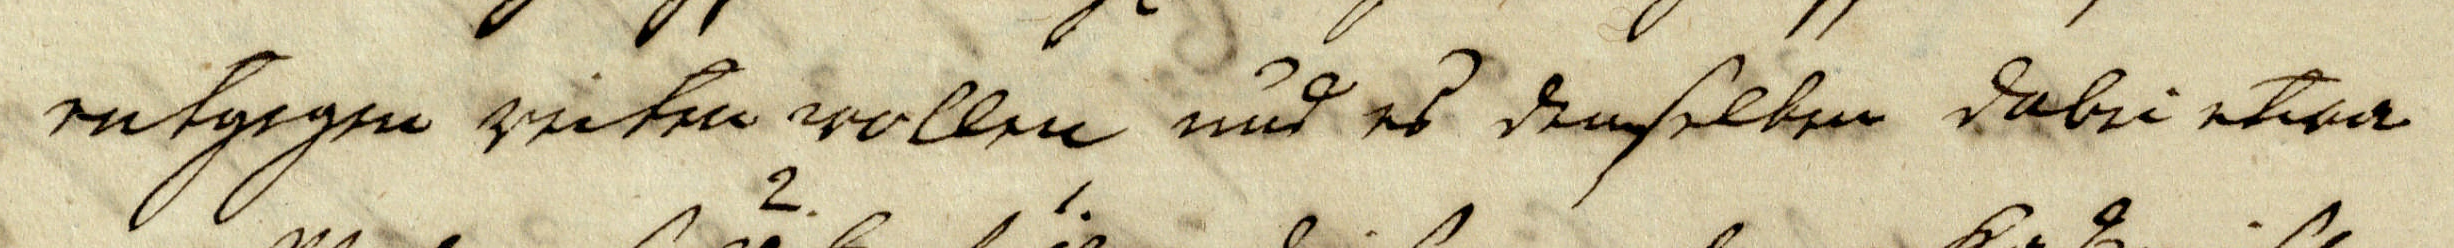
entgegen reiten wollen und es denselben dabei etwa
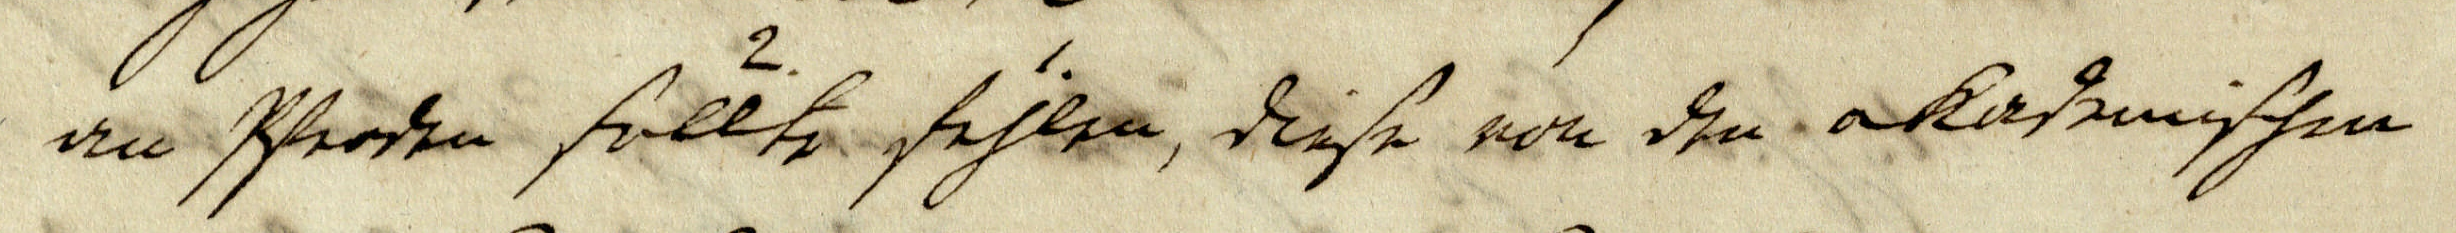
an Pferden sollte fehlen, diese von den akademischen
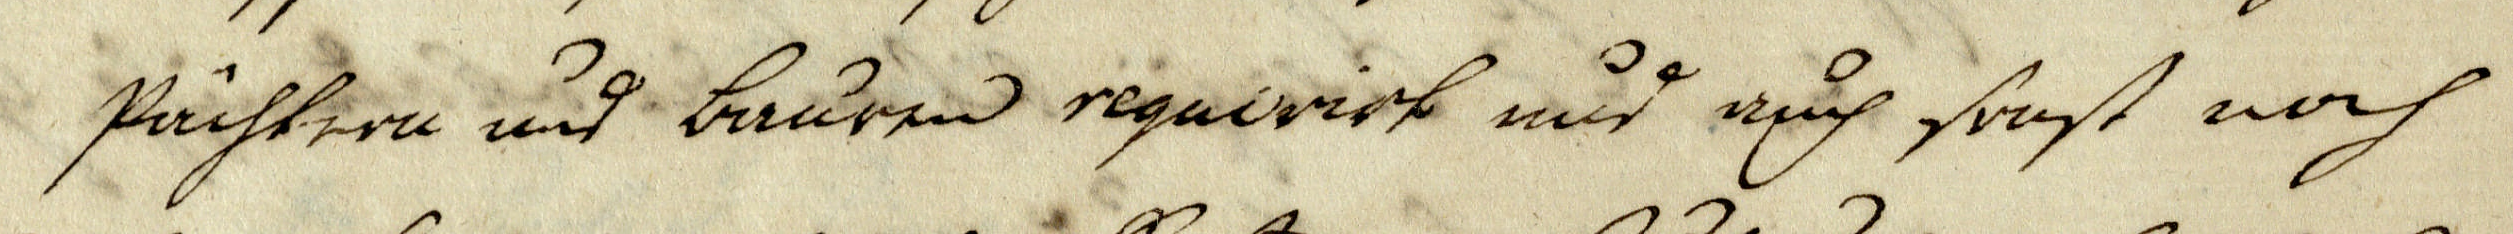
Pächtern und Bauren requirirt und auch sonst noch
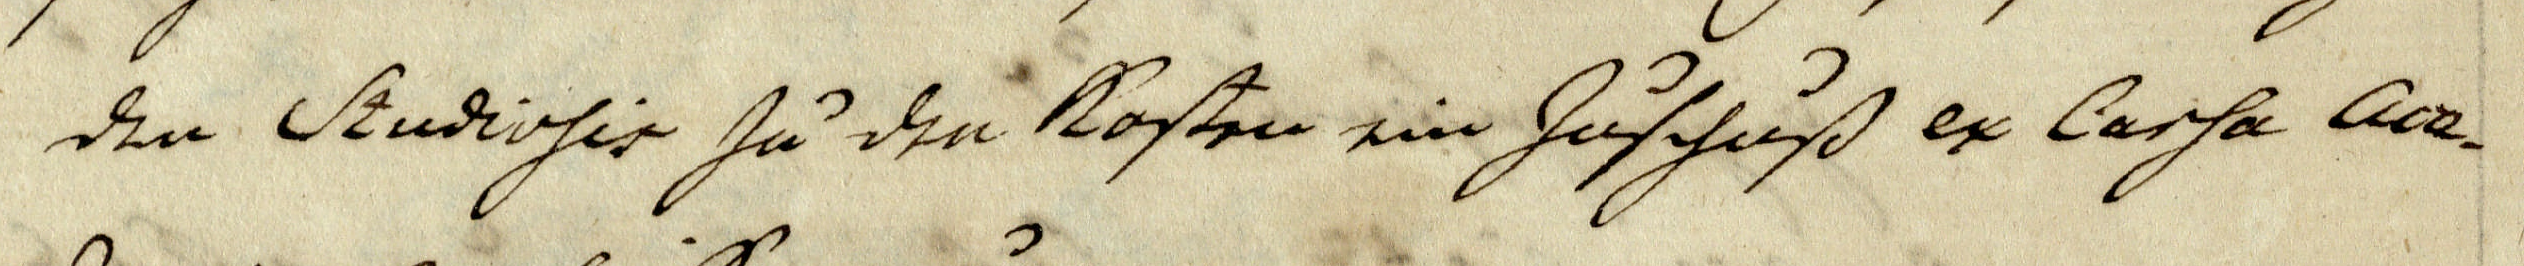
den Studiosis zu den Kosten ein Zuschuß ex Cassa Aca¬
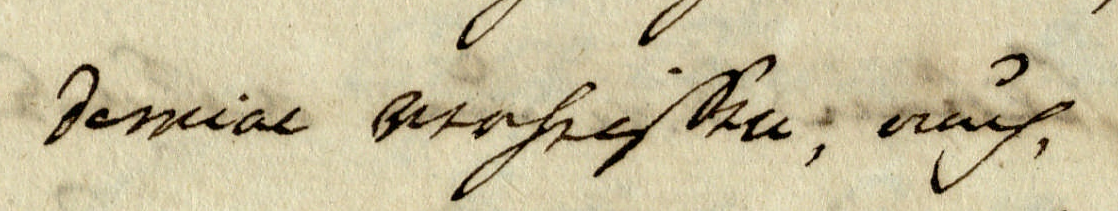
demiae verheissen, auch
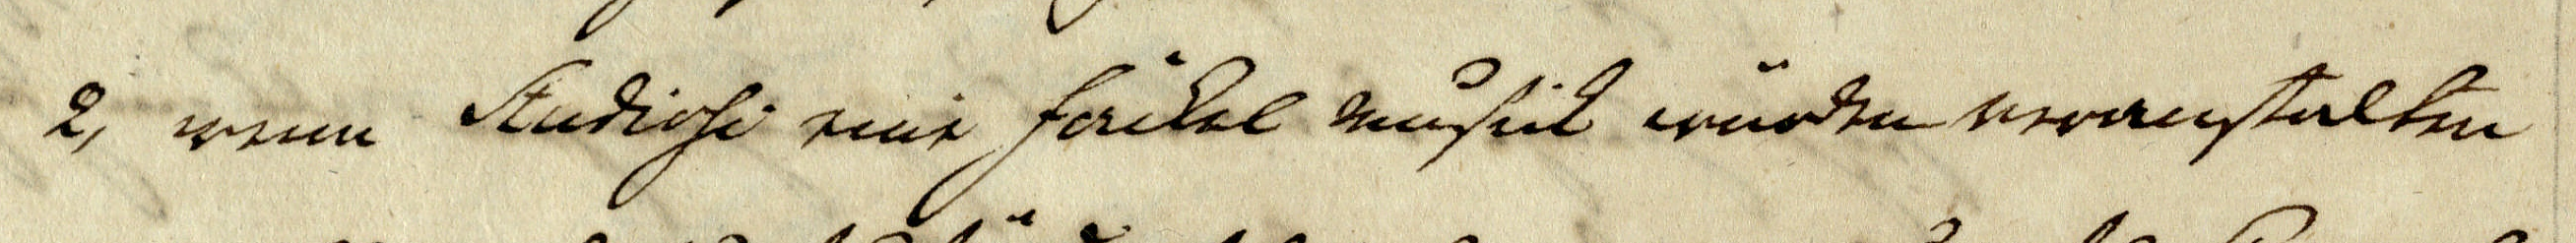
2, wenn Studiosi eine Fackelmusick würden veranstalten
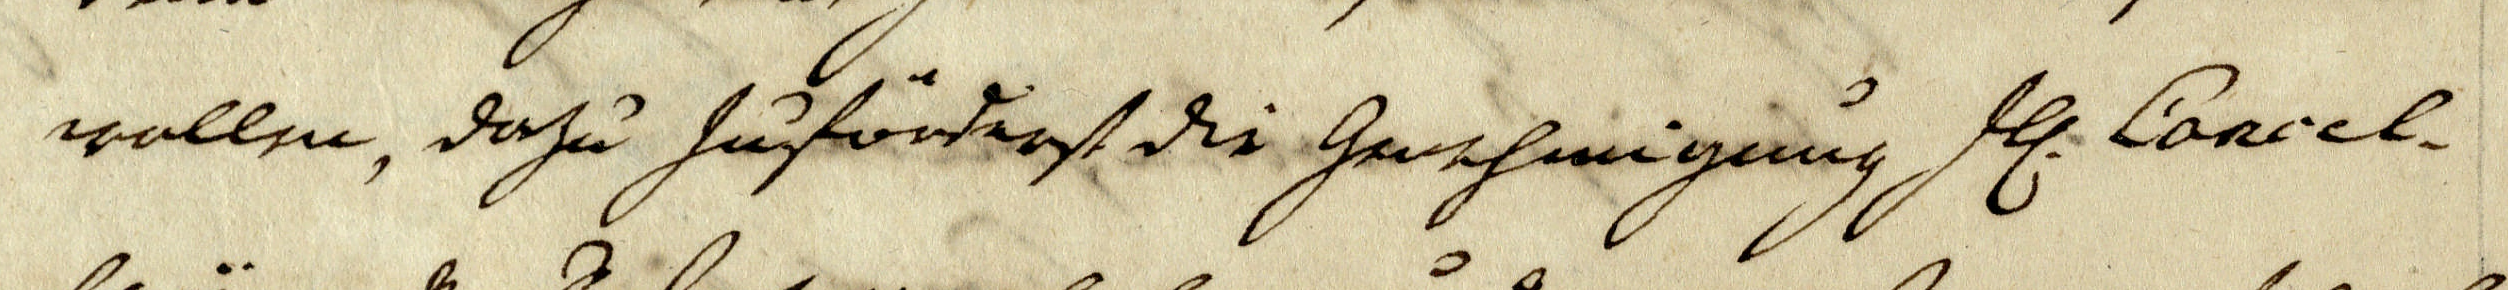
wollen, dazu zuförderst die Genehmigung Ill. Cancel¬
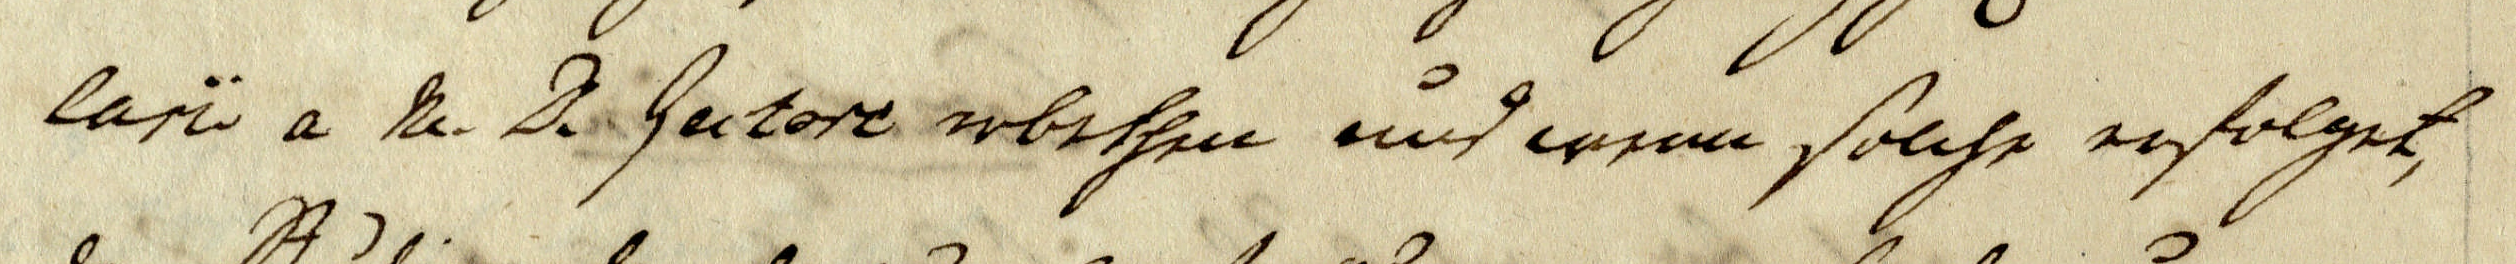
larii a M. D. Rectore erbethen und wenn solche erfolget,
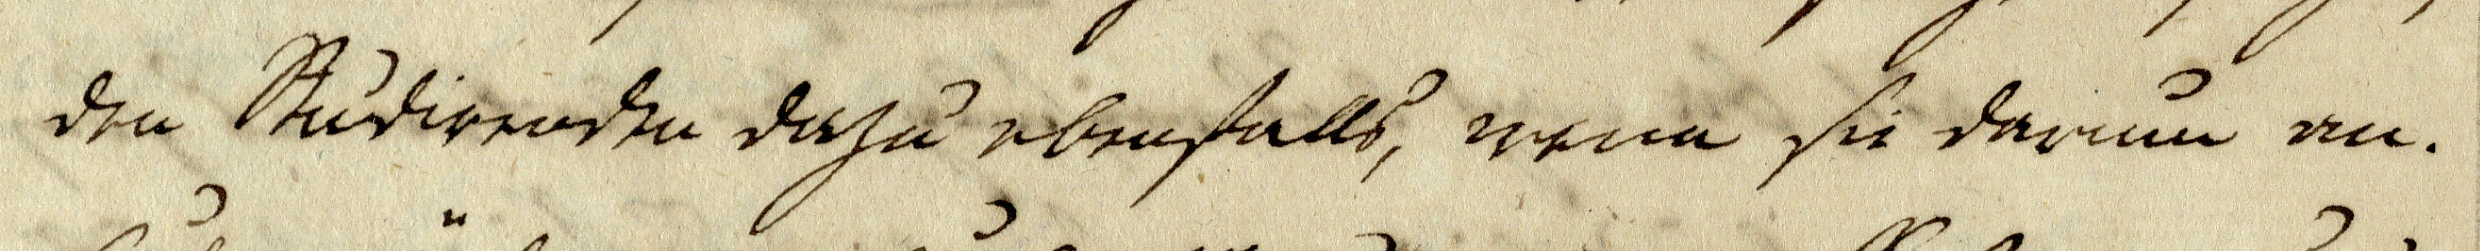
den Studirenden dazu ebenfalls, wenn sie darum an¬
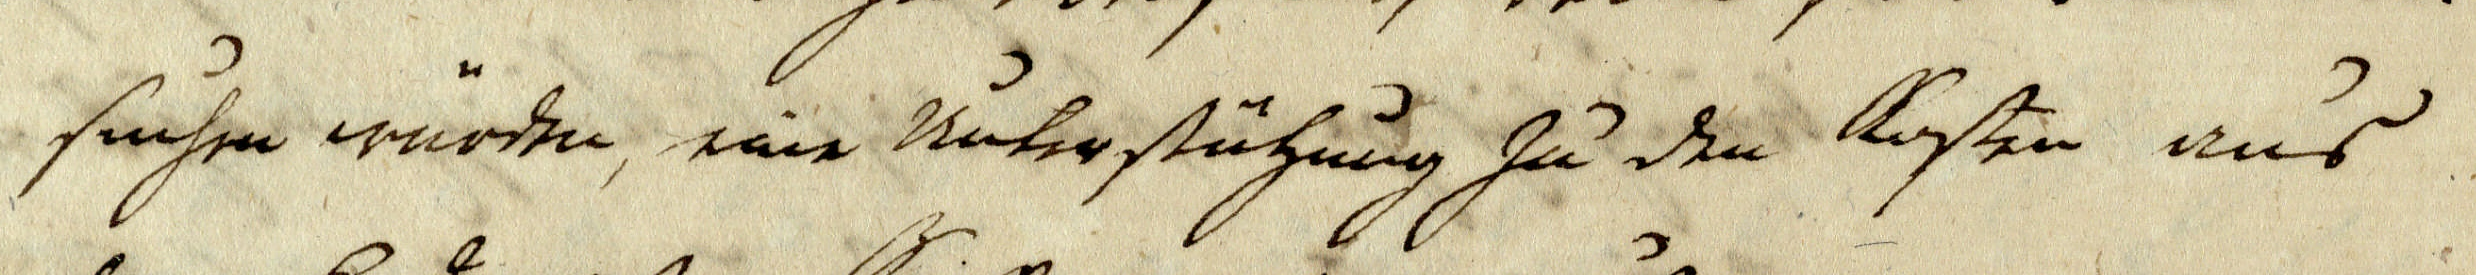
suchen würden, eine Unterstützung zu den Kosten aus
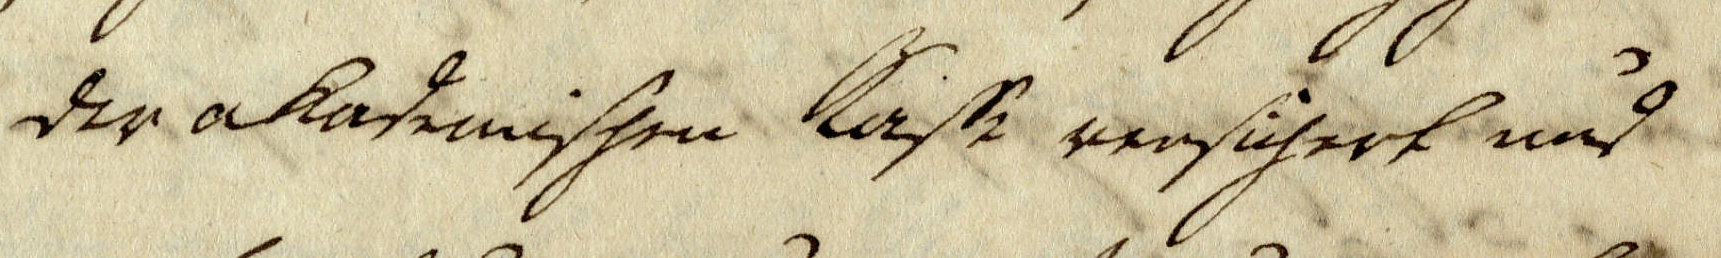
der akademischen Kasse versichert und
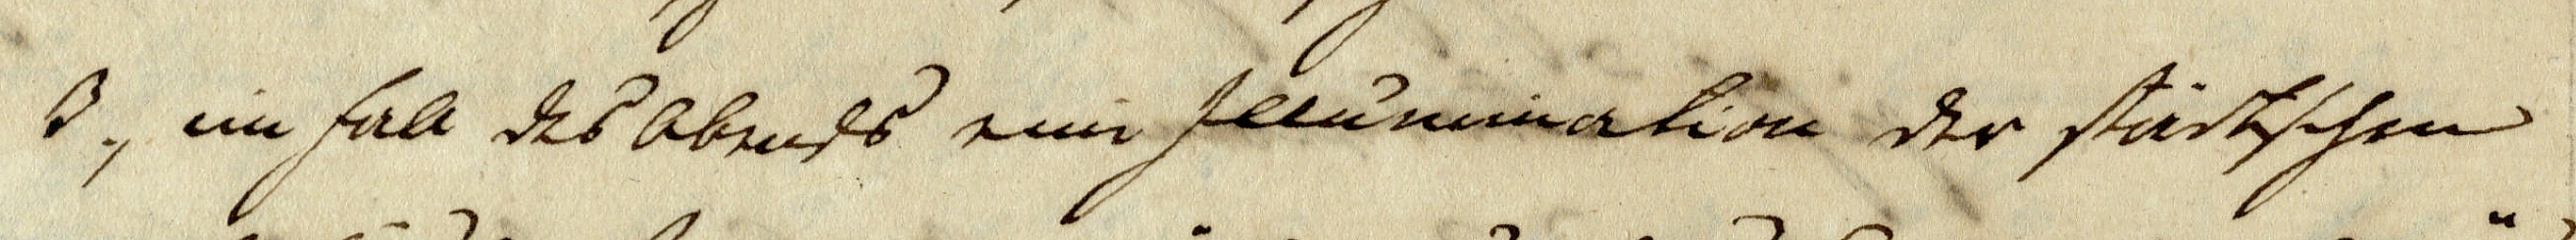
3, im Fall des Abends eine Illumination der städtischen
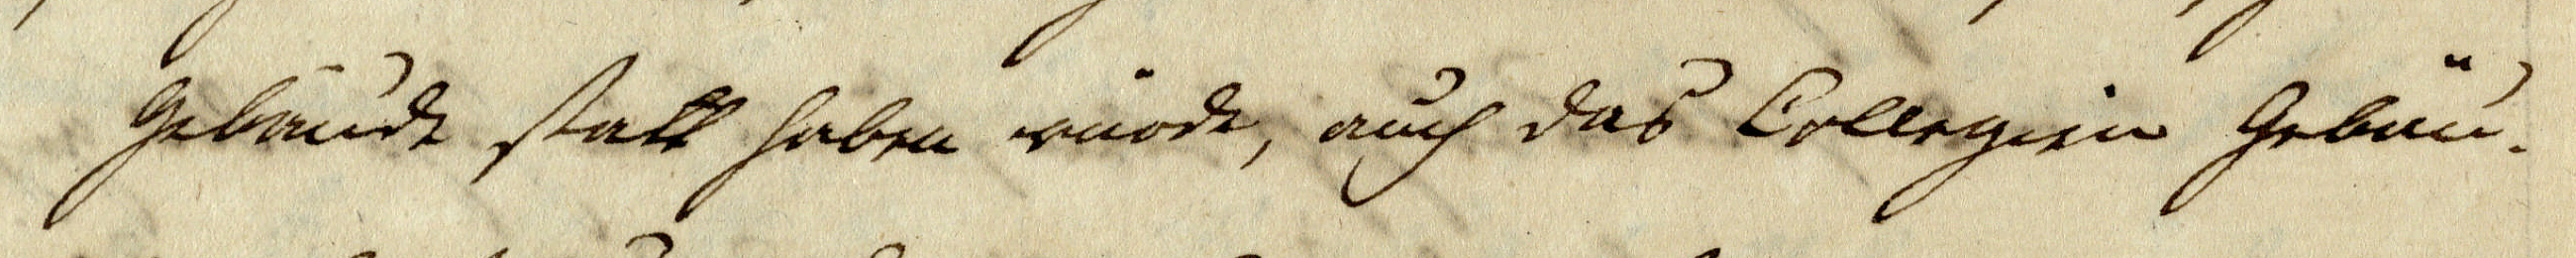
Gebäude statt haben würde, auch das Collegien Gebäu¬
